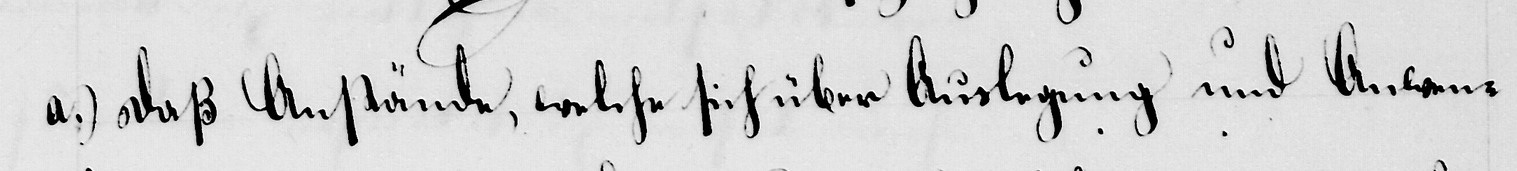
a.) Daß Anstände, welche sich über Auslegung und Anwen¬
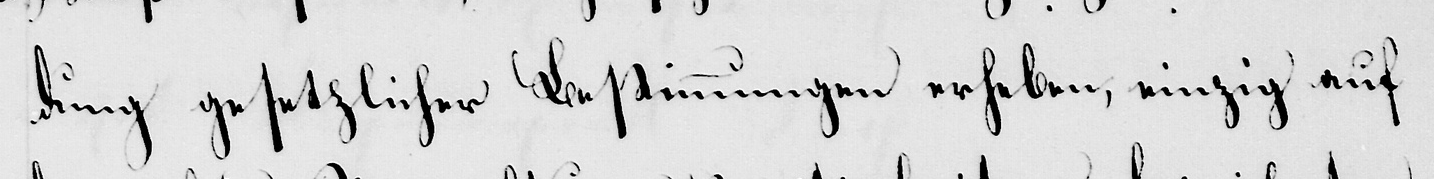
dung gesetzlicher Bestimmungen erheben, einzig auf
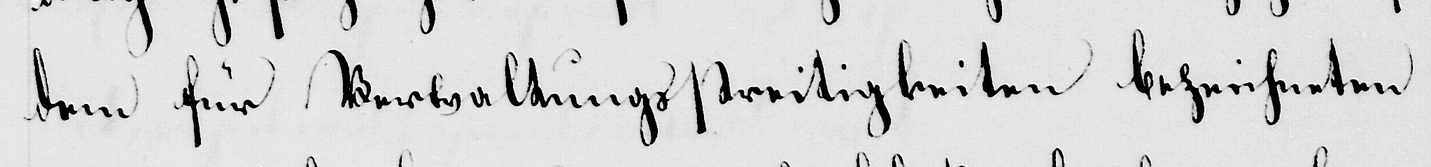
dem für Verwaltungsstreitigkeiten bezeichneten
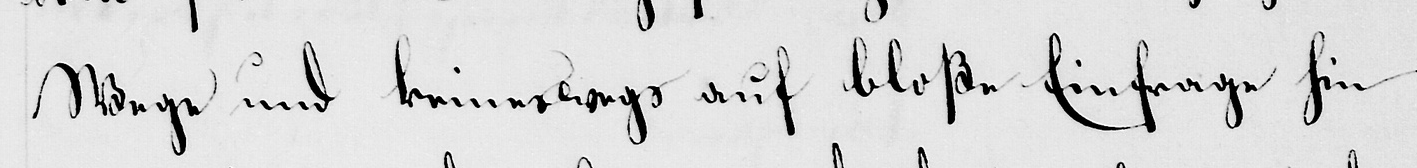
Wege und keineswegs auf bloße Einfrage hin
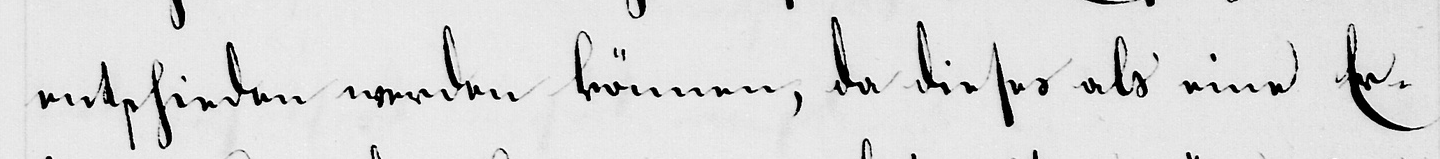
entschieden werden können, da dieses als eine Er¬
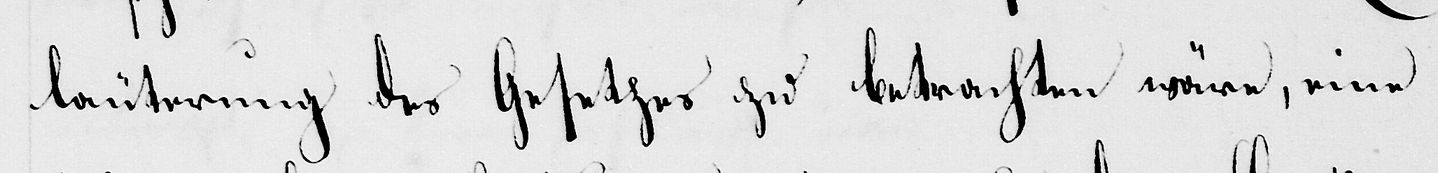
läuterung des Gesetzes zu betrachten wäre, eine
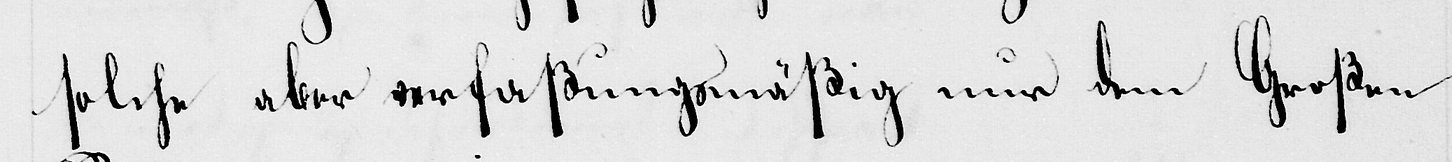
solche aber verfaßungsmäßig nur dem Großen
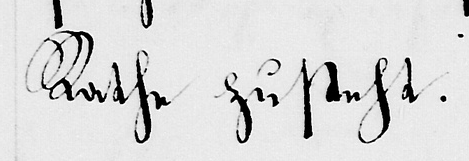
Rathe zusteht.
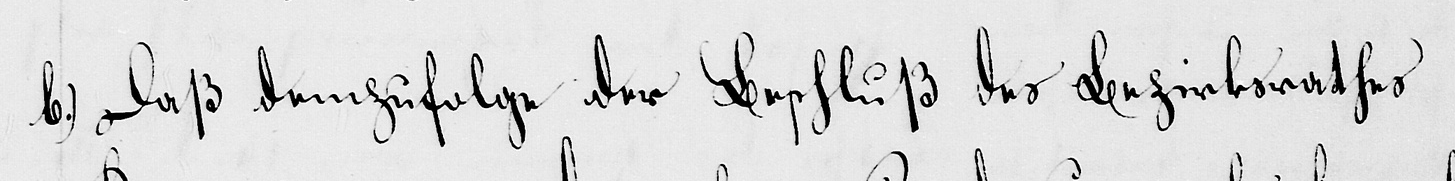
b.) Daß demzufolge der Beschluß des Bezirksrathes
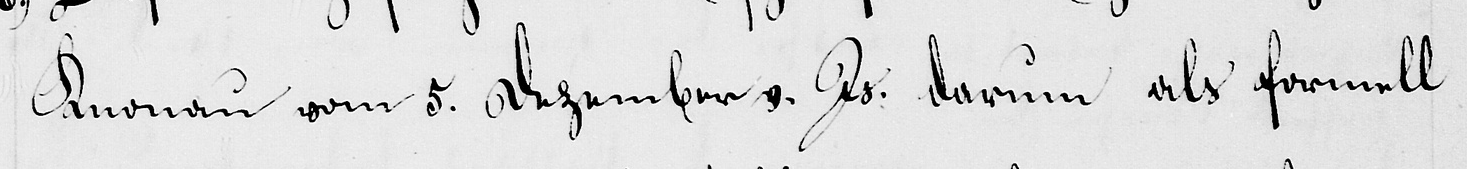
Knonau vom 5. Dezember v. Js. darum als formell
